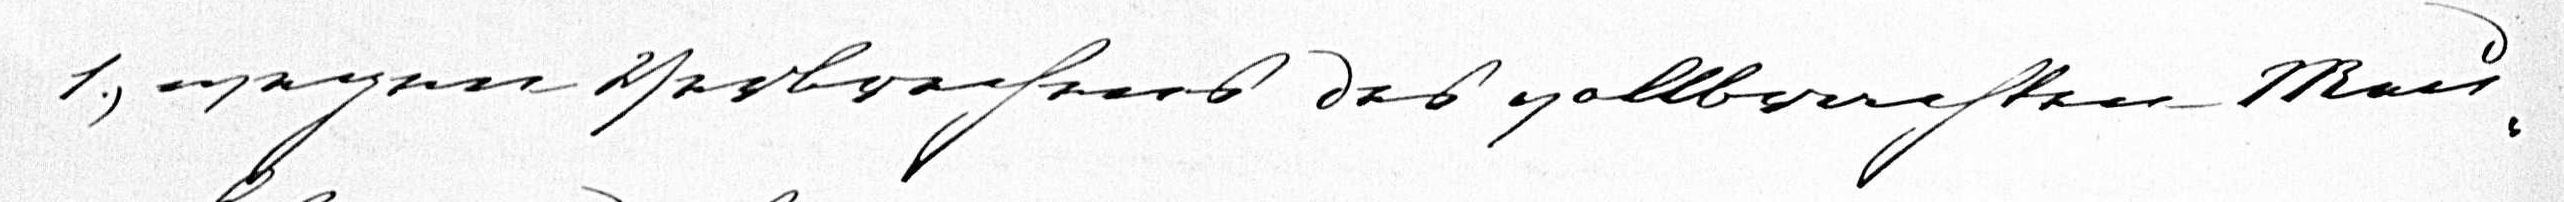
1.) wegen Verbrechens des vollbrachten Meu¬
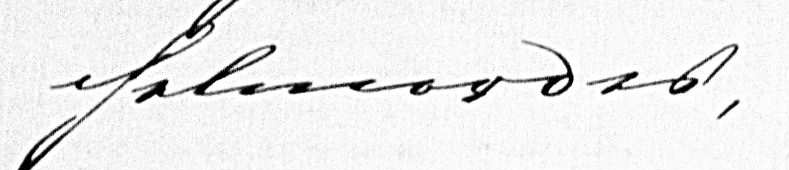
chelmordes,
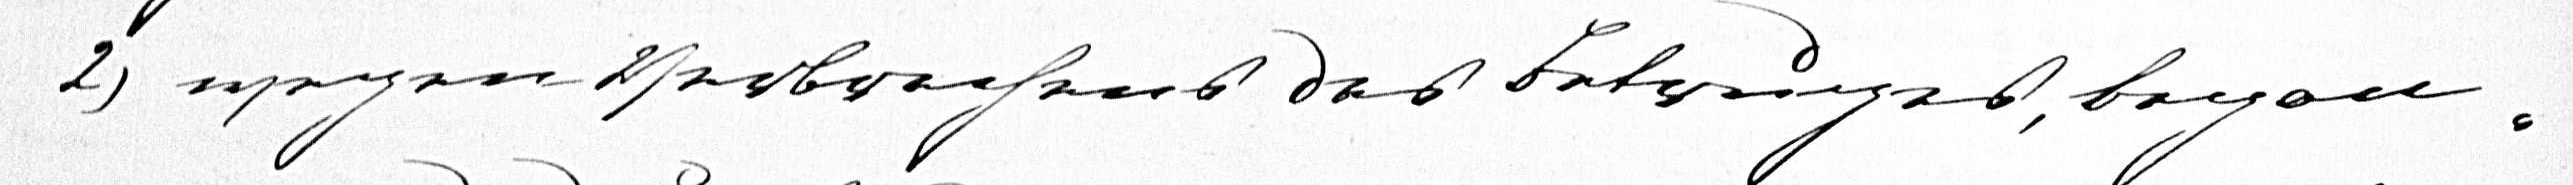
2) wegen Verbrechens des Betruges, began¬
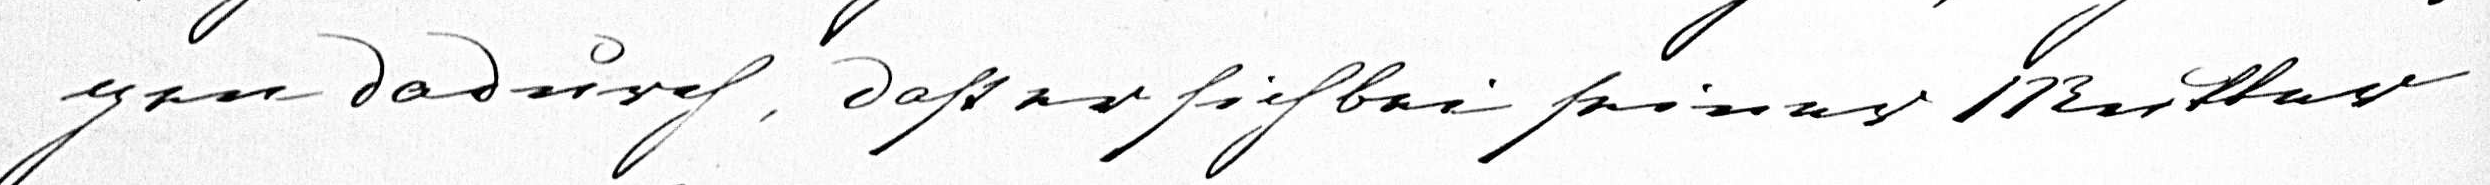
gen dadurch, daß er sich bei seiner Mutter
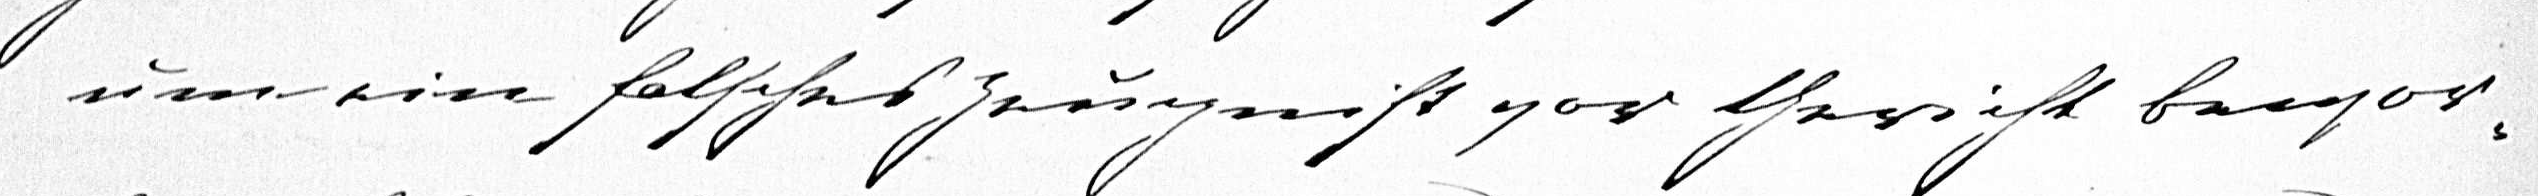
um ein falsches Zeugniß vor Gericht bewor¬
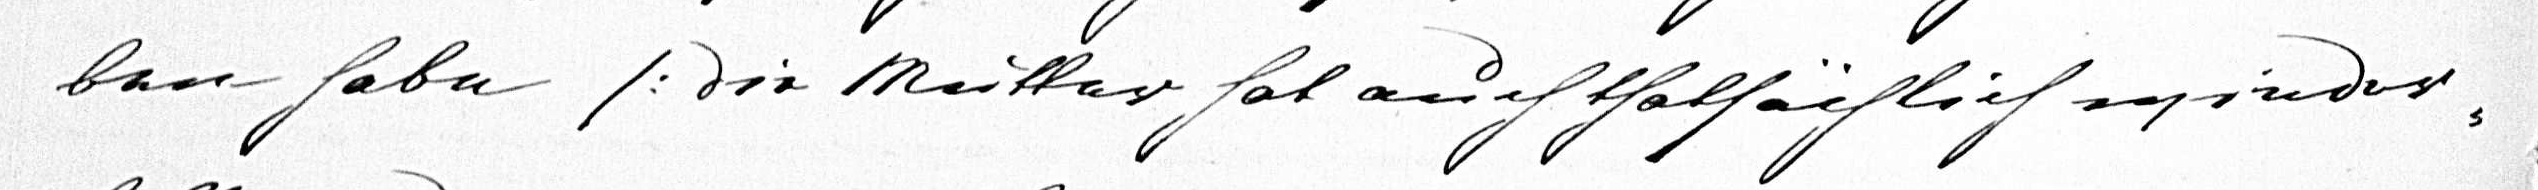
ben habe /: die Mutter hat auch thatsächlich wieder¬
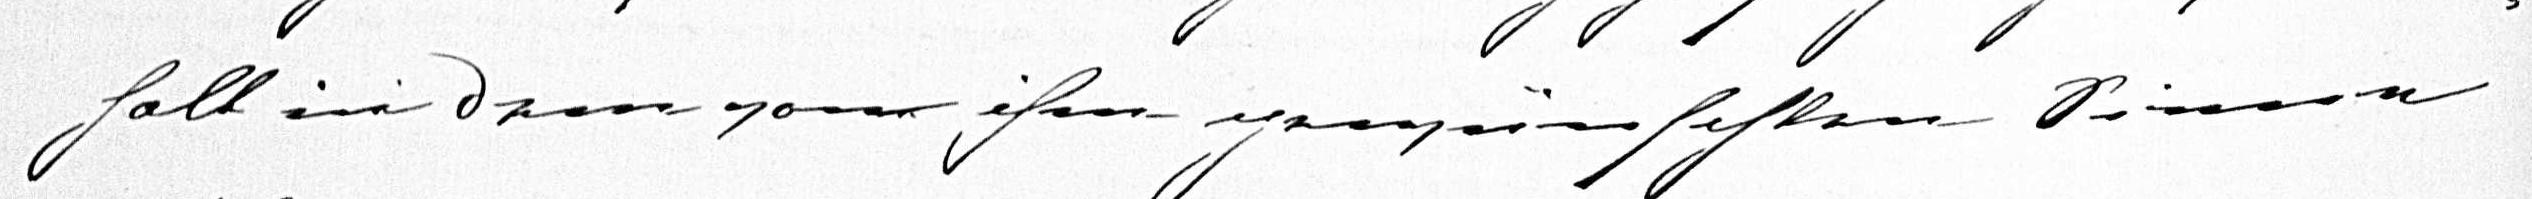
holt indem von ihm gewünschten Sinne
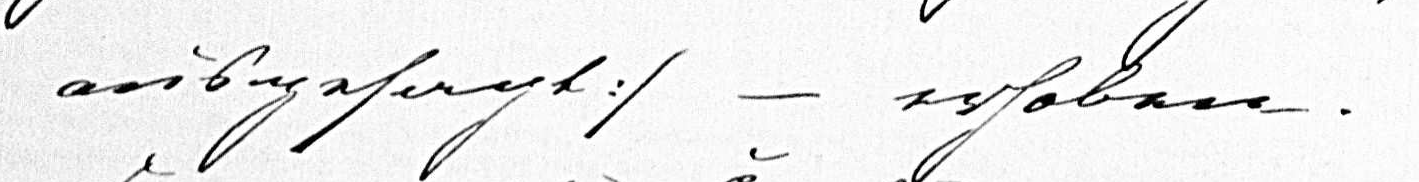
ausgesagt :/ - erhoben.
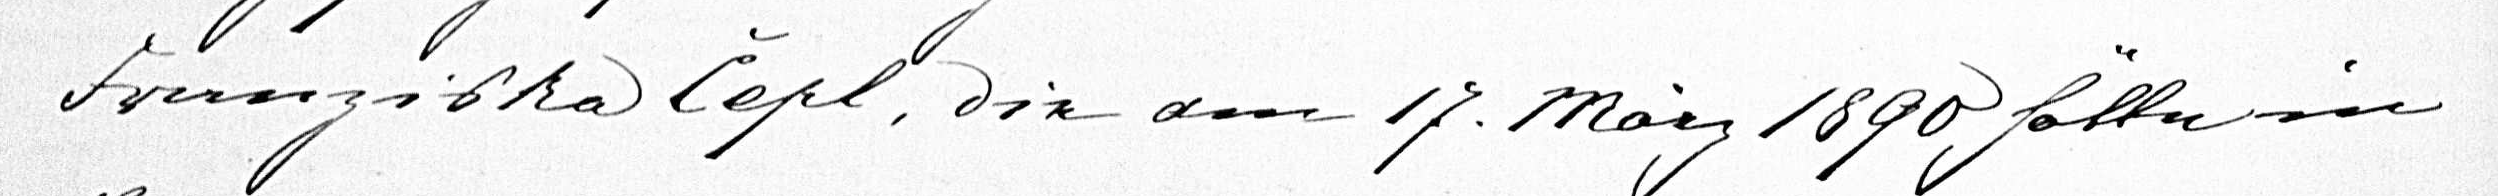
Franziska Čepl, die am 17. März 1890 hätte in
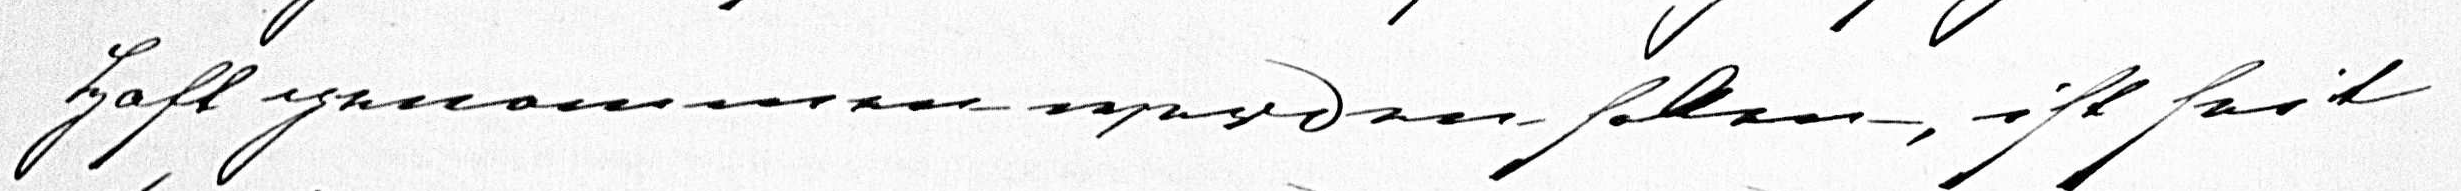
Haft genommen werden sollen, ist seit
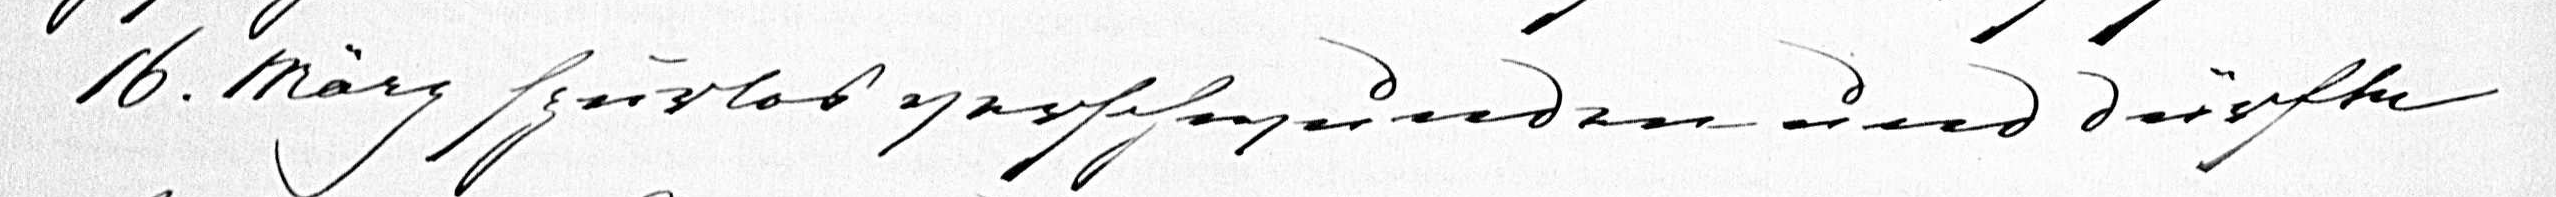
16. März spurlos verschwunden und dürfte
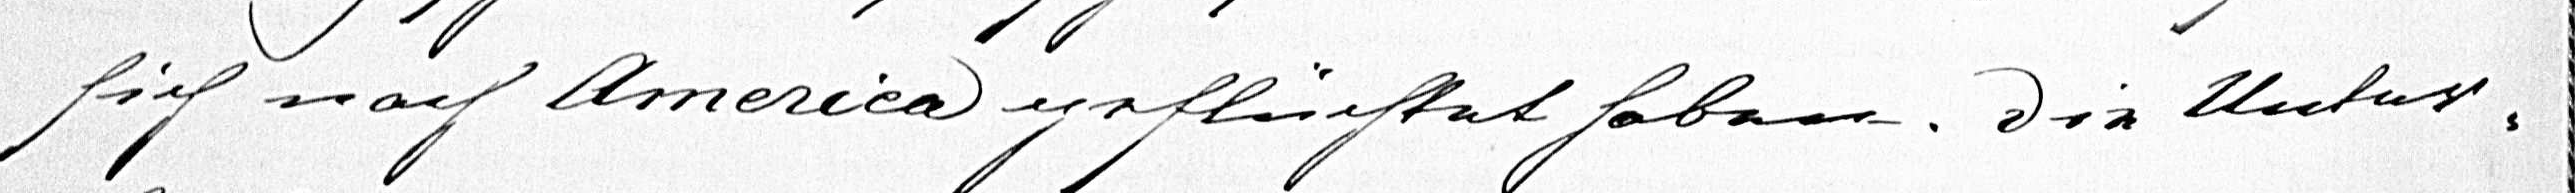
sich nach America geflüchtet haben. Die Unter¬
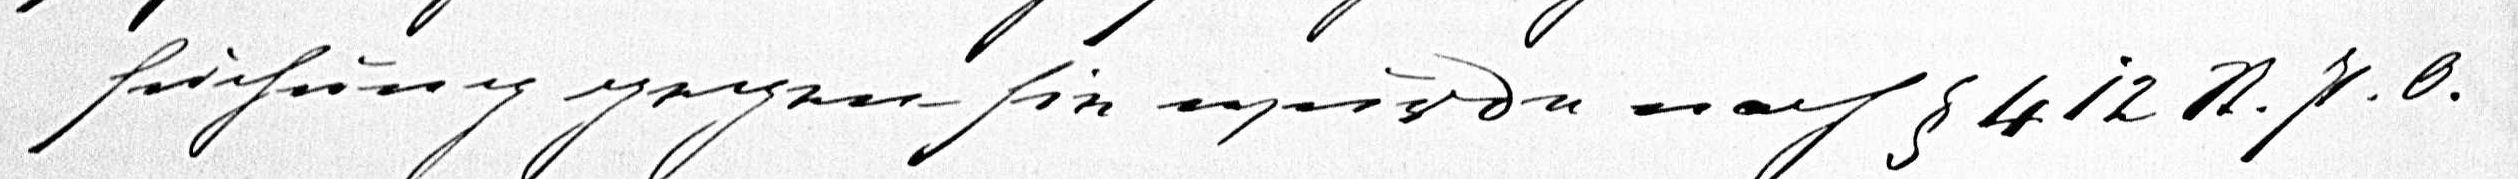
suchung gegen sie wurde nach § 412 St. P. O.
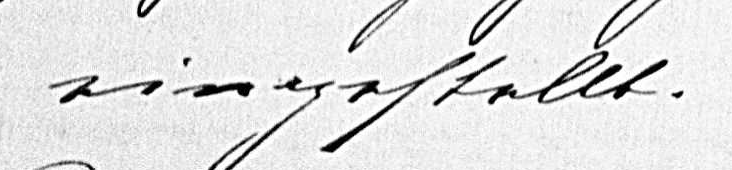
eingestellt.
